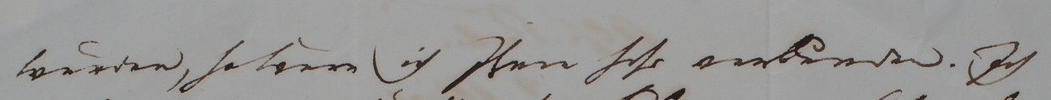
würden, so wäre ich Ihnen sehr verbunden. Ich
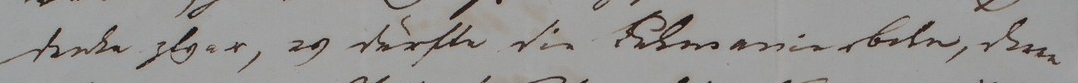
denke zwar, es dürfte die Lukmanierbahn, deren
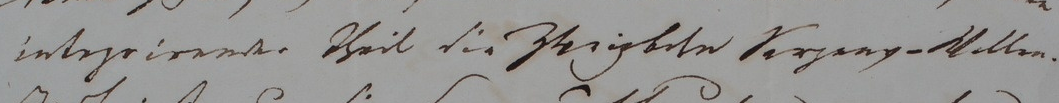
integrirender Theil die Zweigbahn Sargans–Wallen-
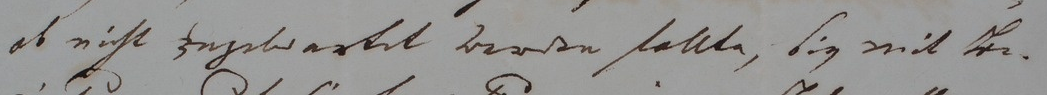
ob nicht zugewartet werden sollte, bis mit Be-
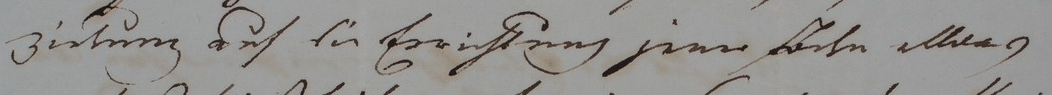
ziehung auf die Errichtung jener Bahn etwas
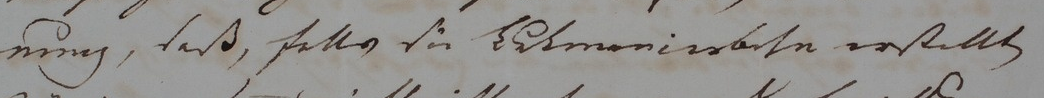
nung, daß, falls die Lukmanierbahn erstellt
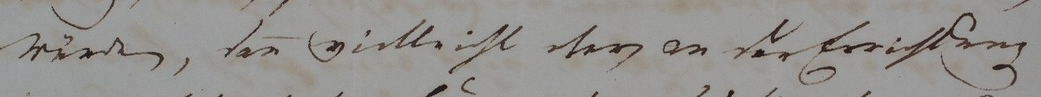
würde, dann vielleicht eher an der Errichtung
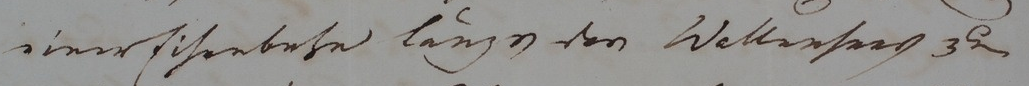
einer Eisenbahn längs des Wallensees zu
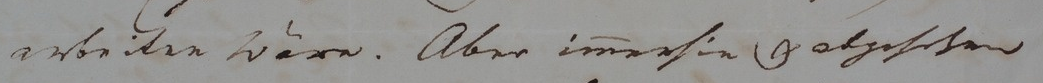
arbeiten wäre. Aber immerhin & abgesehen
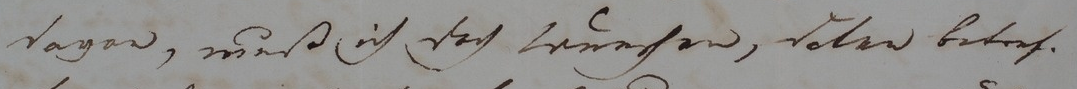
davon, muß ich doch wünschen, Daten betref-
